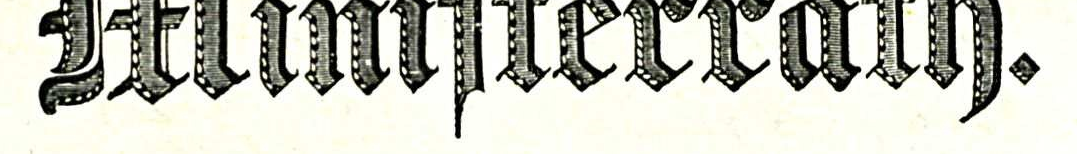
Ministerrath
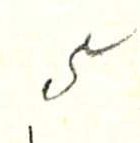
5
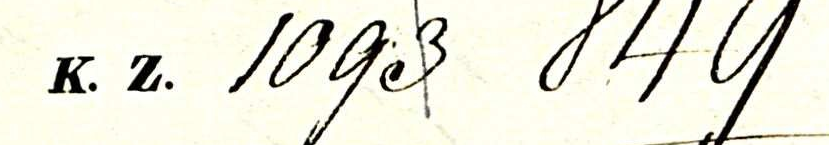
KZ 1093 [1]849
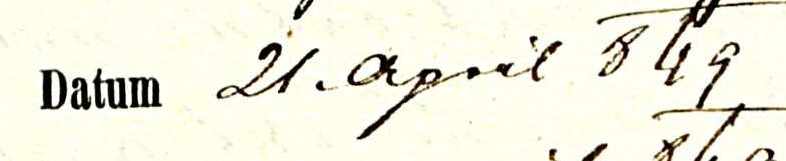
Datum 21. April 1849
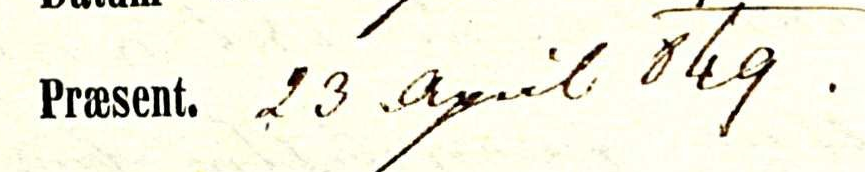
Praesent 23. April [1]849
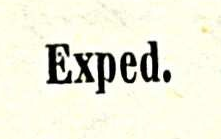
Exped.
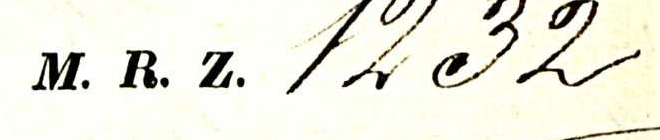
MRZ 1232
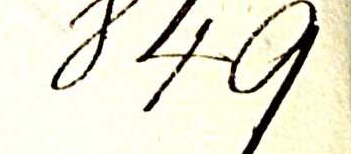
849
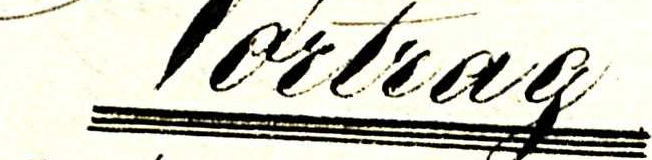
Vortrag
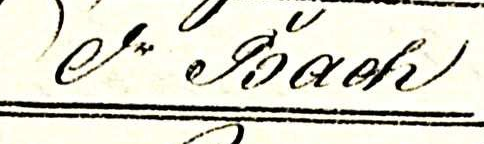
Dr. Bach
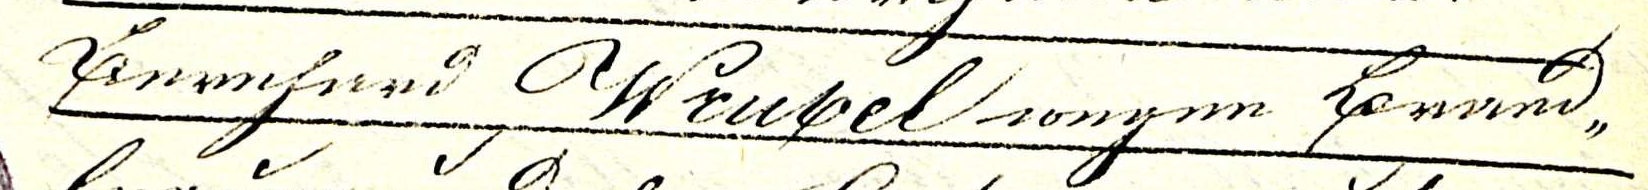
Bernhard Wrubel wegen Brand¬
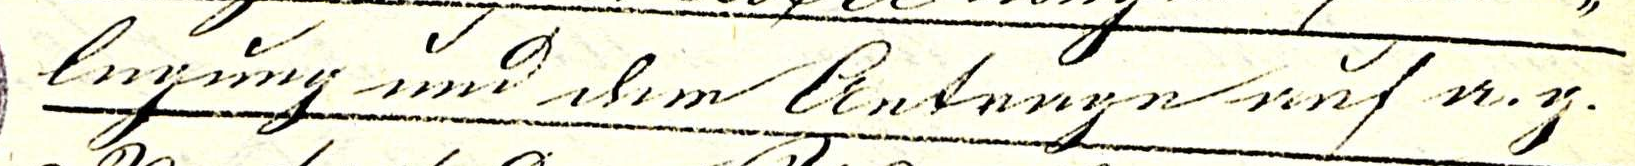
legung und dem Antrage auf a.g.
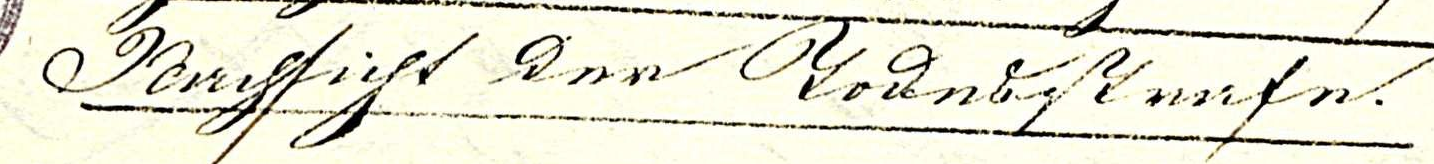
Nachsicht der Todesstrafe
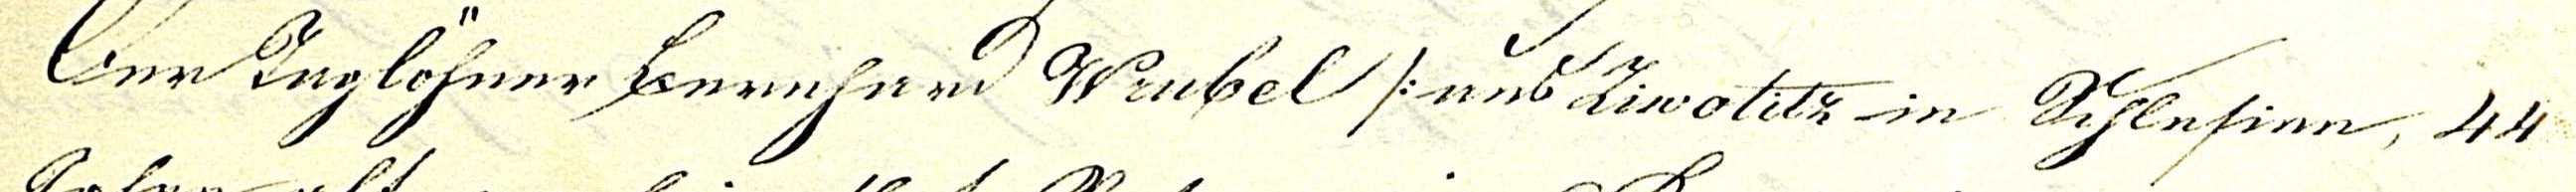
Der Taglöhner Bernhard Wrubel (aus Ziwolitz in Schlesien, 44
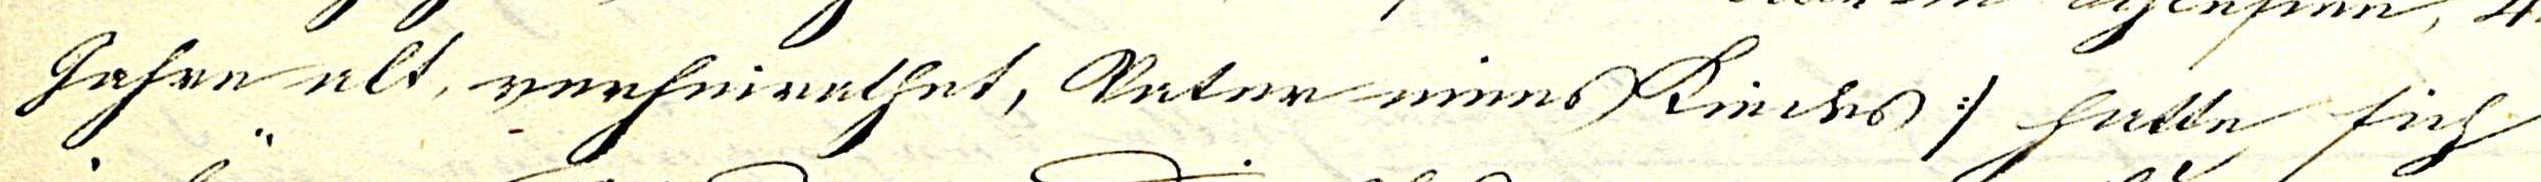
Jahre alt, verheirathet, Vater eines Kindes) hatte sich
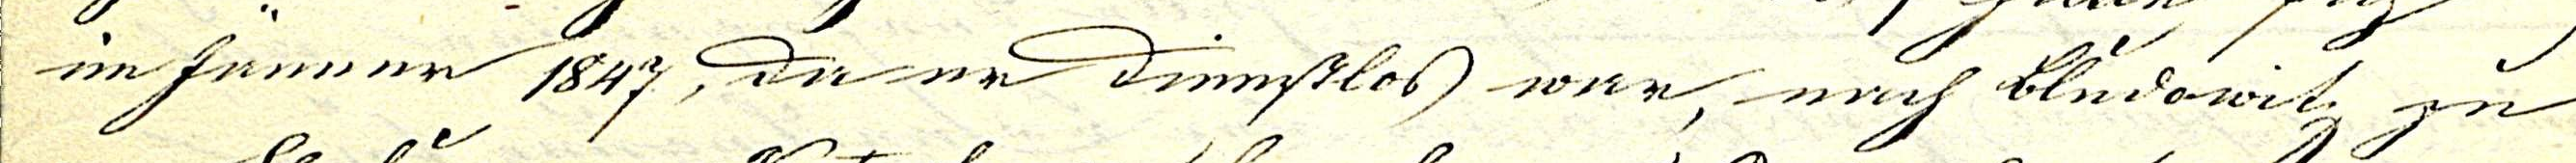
in Jänner 1847, da er dienstlos war, nach Bludowitz zu
